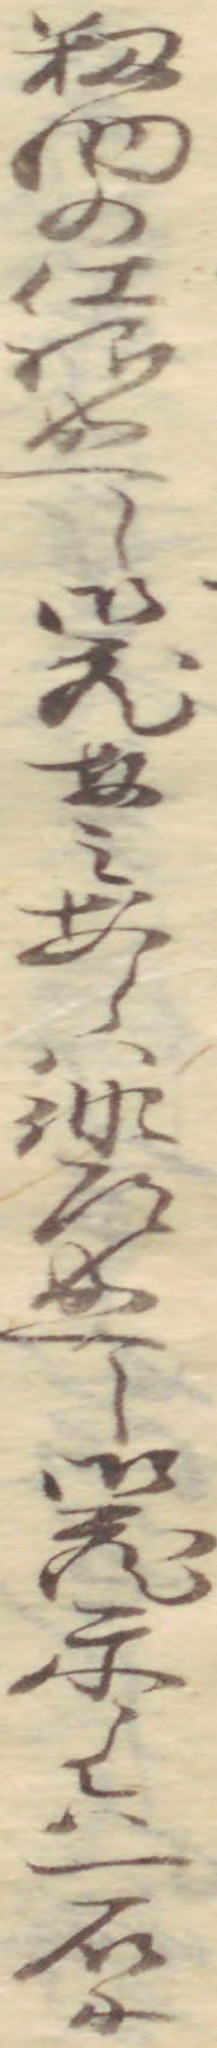籾納の仕様成へし御蔵なみならは非道成へし御蔵米ニては一石に
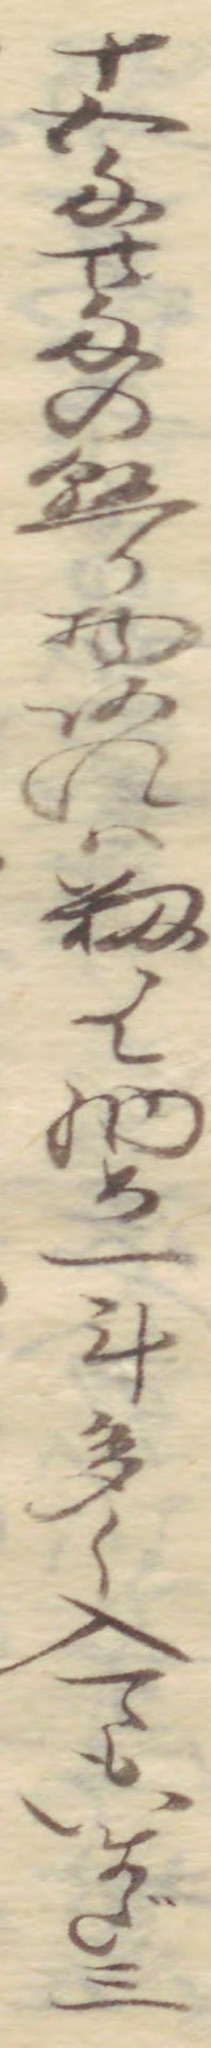十五匁廿匁の懸り物あれは籾ニて納め一斗多く入てもいまだ三
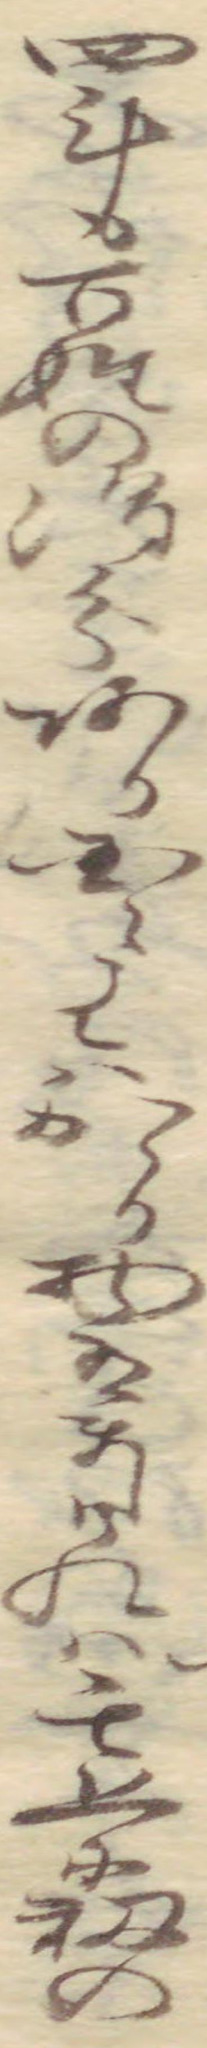四斗も百姓の得分ある国〻ニてはかゝり物有ましけれは其上に籾の
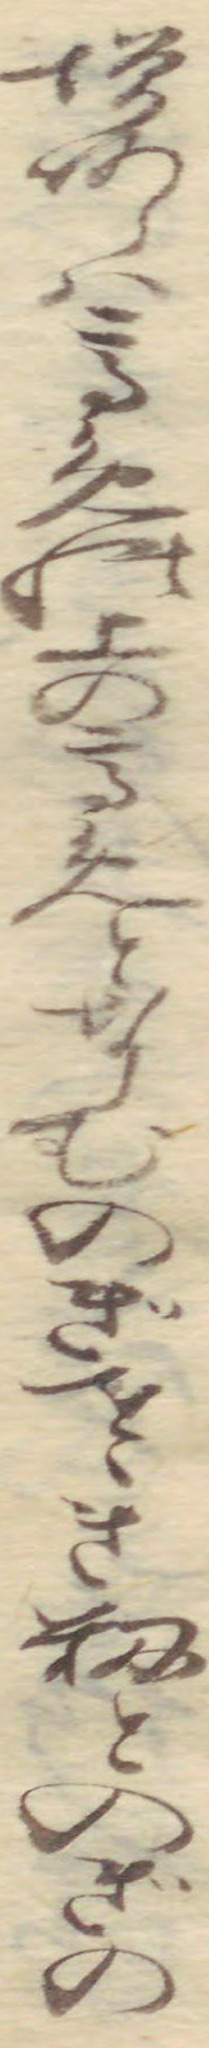増あらは高めの上の高めとならむのぎをゝき籾とのぎの
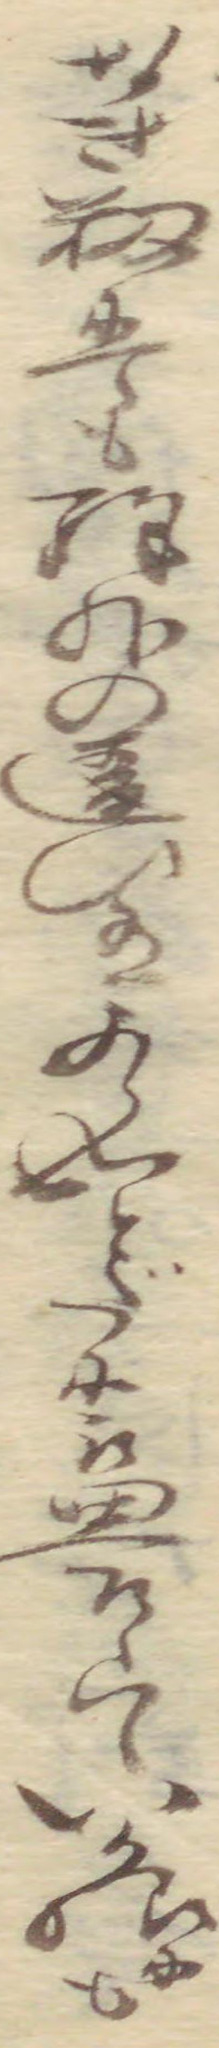なき籾にても殊外の違ひ有可被成とだに被思召候はゝいか様にも
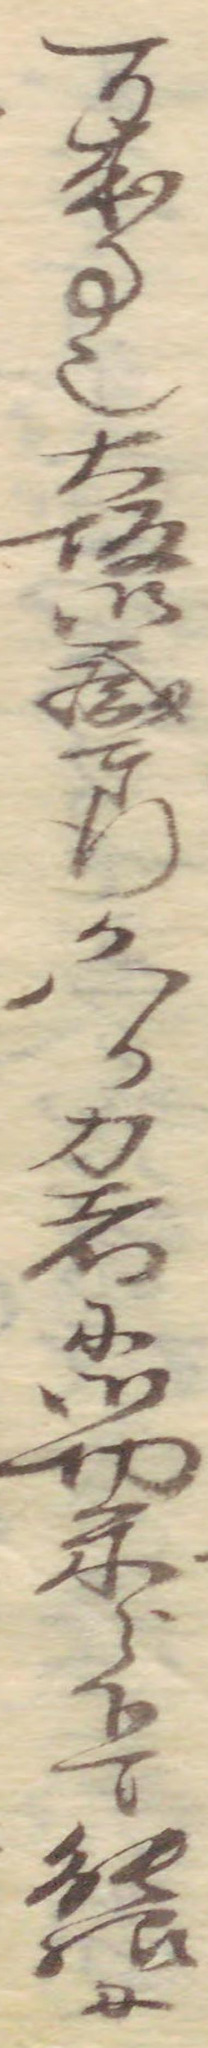可成事也大坂御蔵奉行かはり力者に御切米被下て能様に
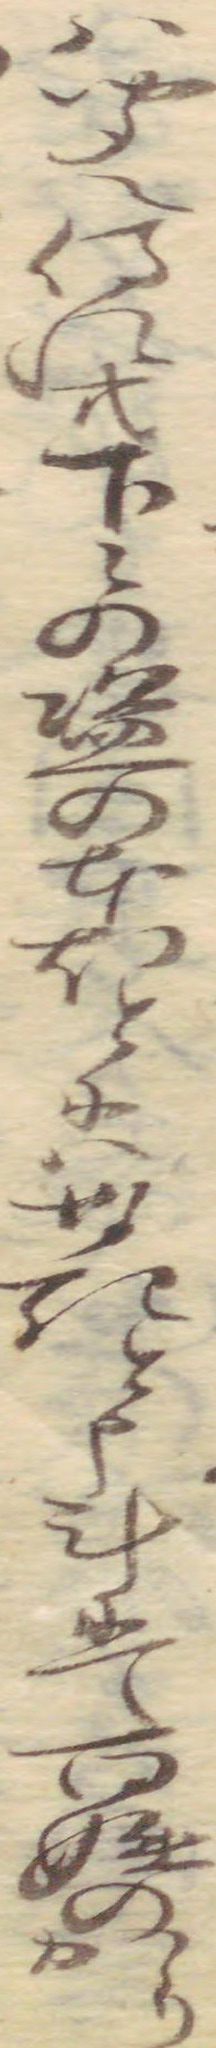は聞え侍れ共下〻の盜の本ほとにはなきと申計にて百姓のかゝり
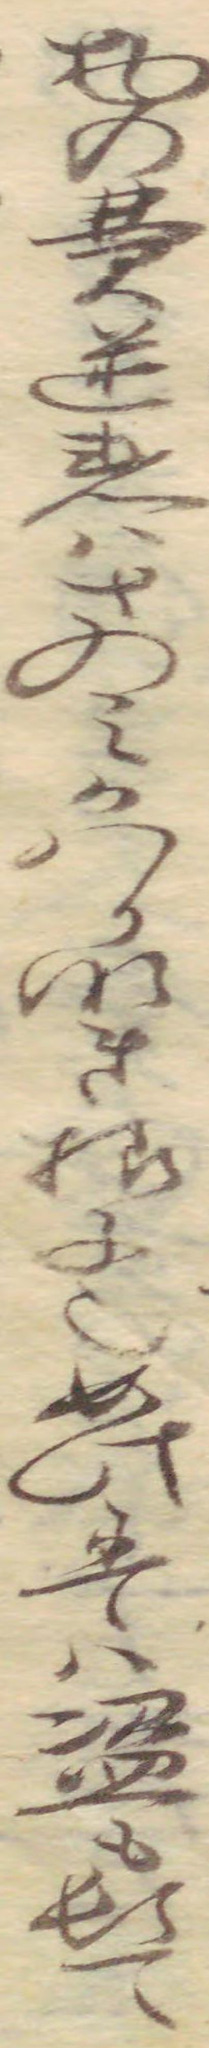物の費迷惑はさのみかはりなき様子也如此にては盜も頓て
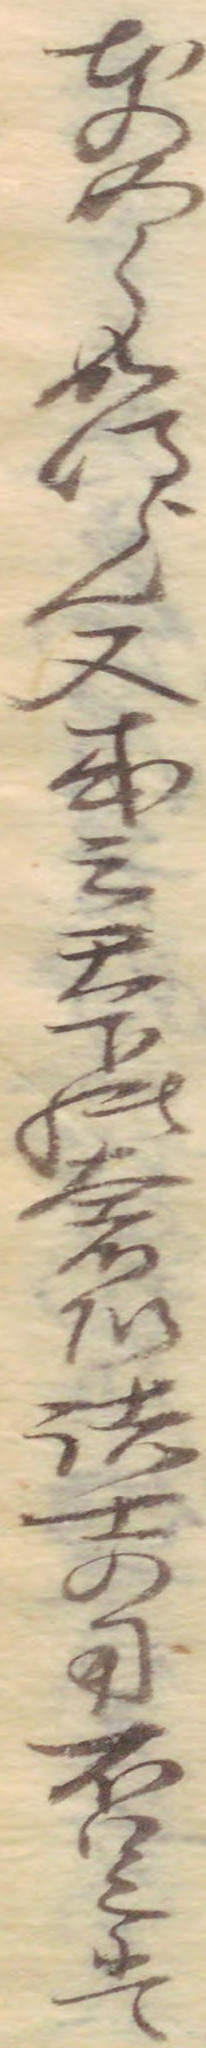本の如く成侍らん又或云天下の奢故諸士の用不足にて

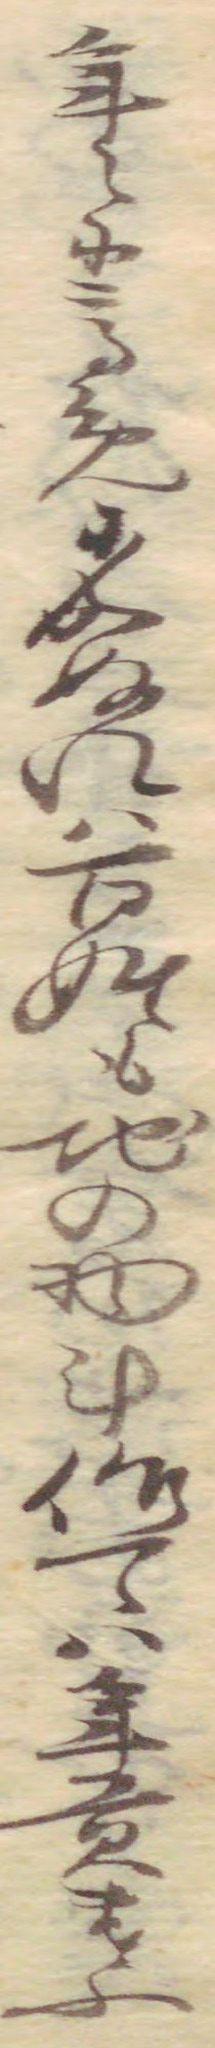年〻に高免に成ぬれは百姓も地の物計作ては年貢まとふ
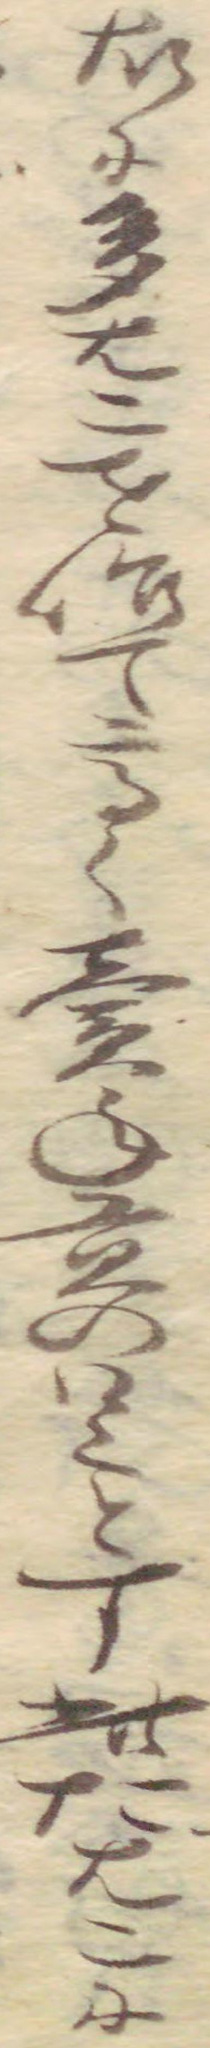故にたはこを作て高く売年貢の足とす此たはこに
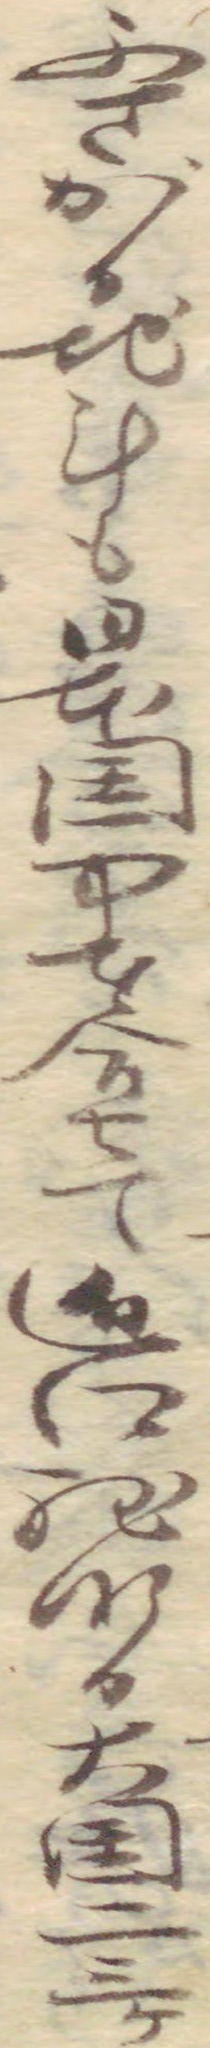ふさがる地計も日本国中を合せて近江程なる大国二三ヶ
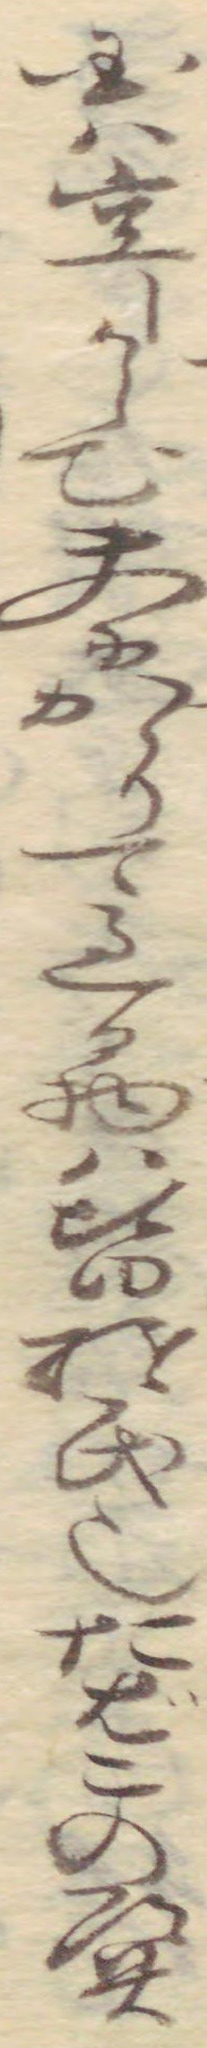国は空しからむ夫にかゝりて過る物は皆遊民也たばこの道具
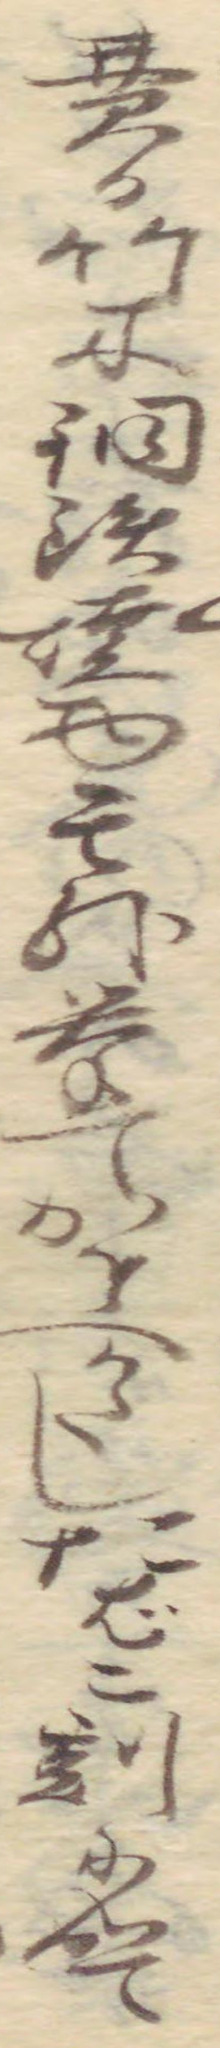費る竹木銅鉄焼物其外挙てかそへかたしたばこ刻に成て
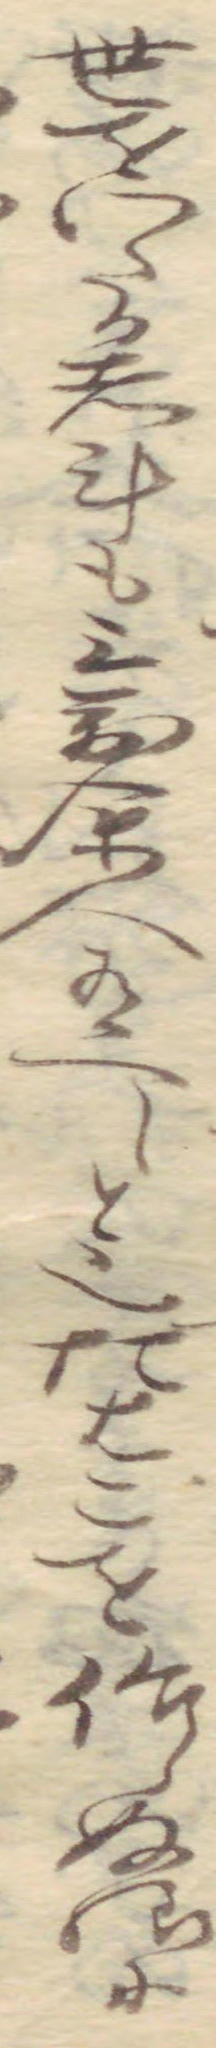世をわたる者計も三万余人有へしと也たはこを作らぬ様に
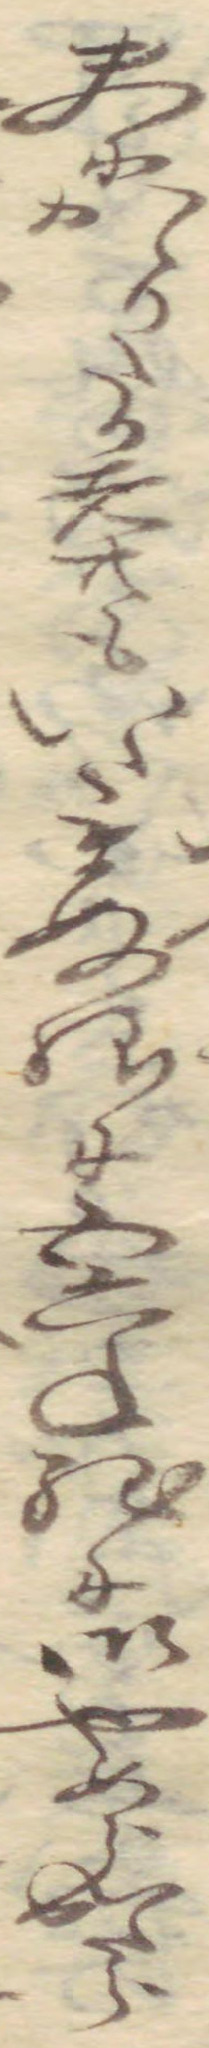夫にかゝりたる者共もいたまぬ様に五六年程に御やめ被成たら
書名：鶯宿雑記. 巻263-264
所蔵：国立国会図書館 National Diet Library, JAPAN
